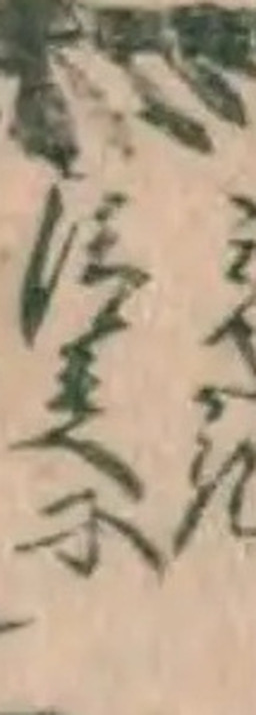清兵衛に
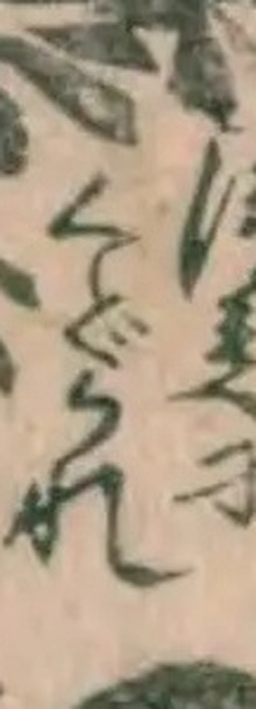くどかれ
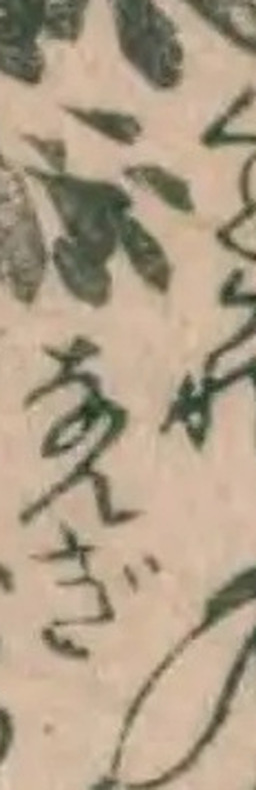なんぎ
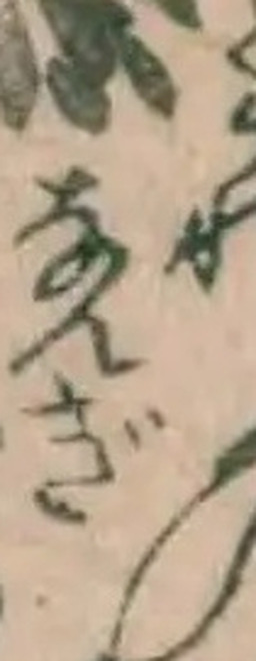なんぎ
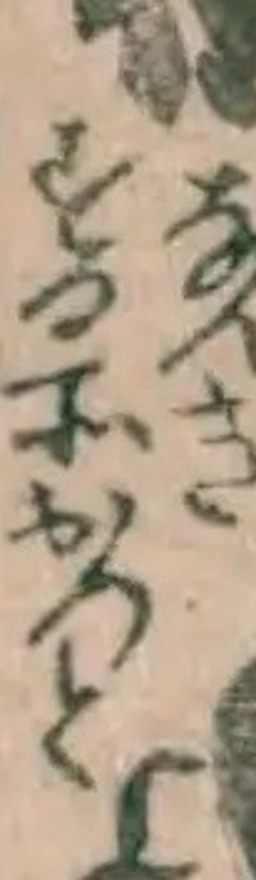する所おつと
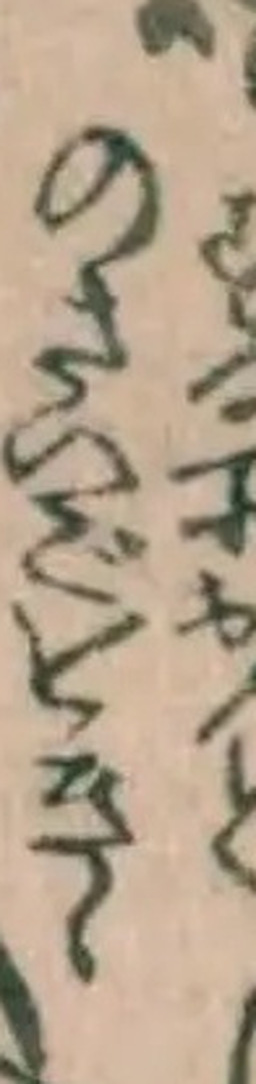のさいごをきゝ
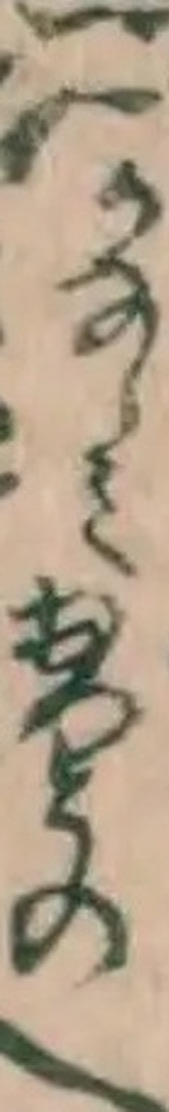かなしみおつとの
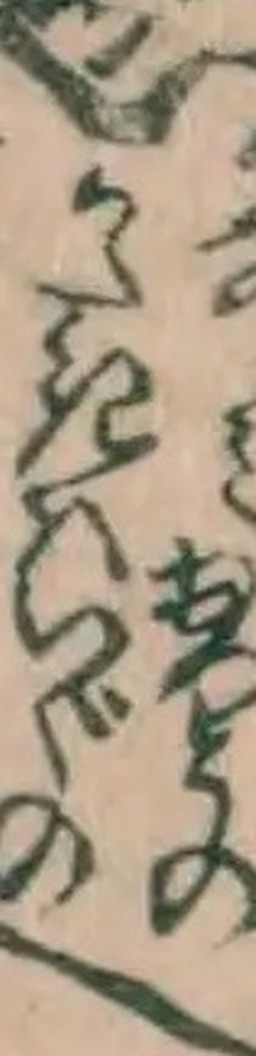かたきはいぐの
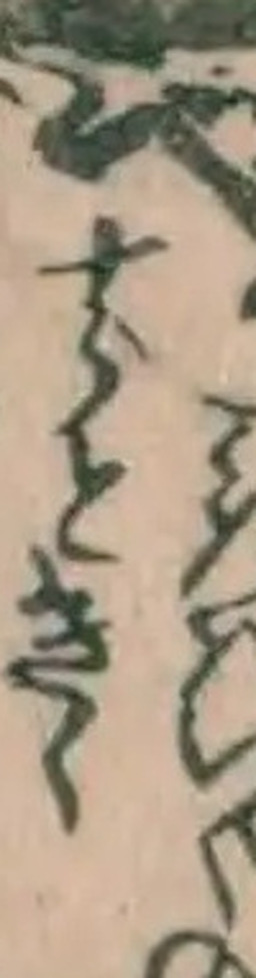十郎ときく
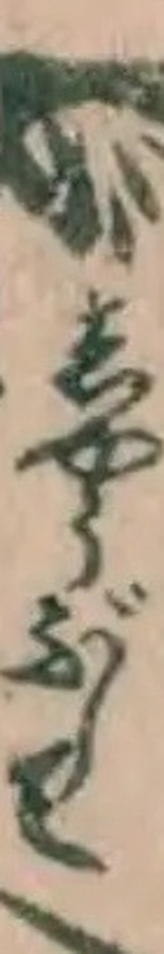しやうぶして
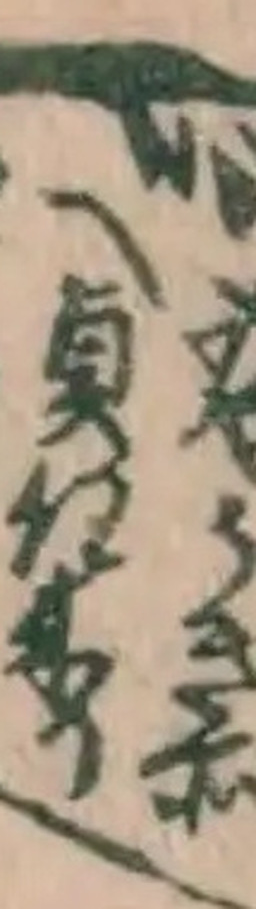へ貞任来り
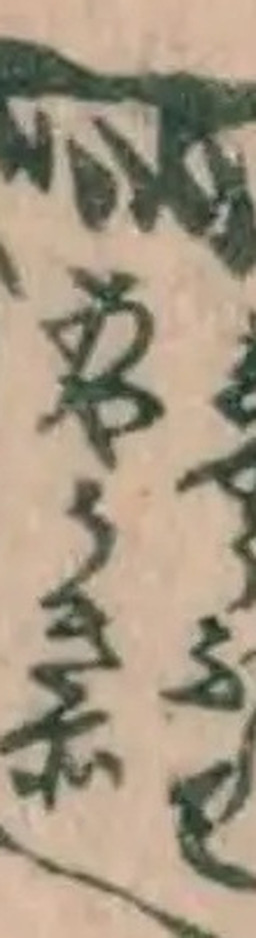あやうき所
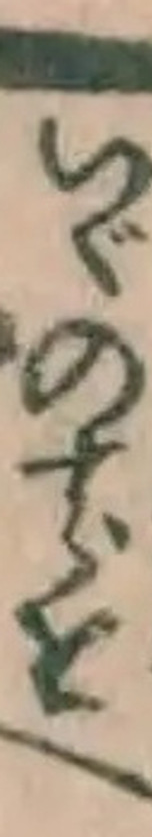いぐの十郎を
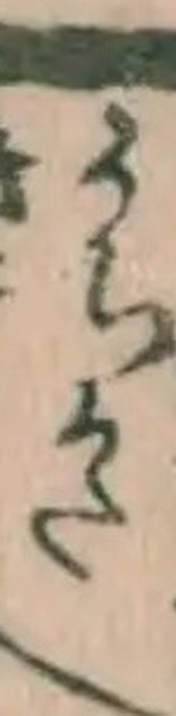うちかた
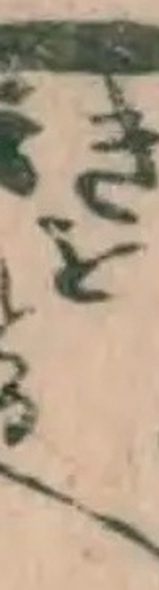きをとる
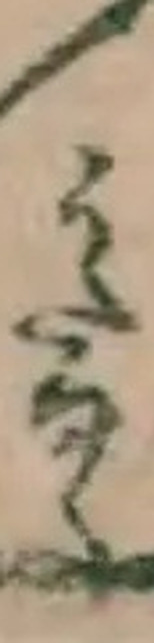うたるゝ
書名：伊達錦對将 : 森田座
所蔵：国立国会図書館 National Diet Library, JAPAN
